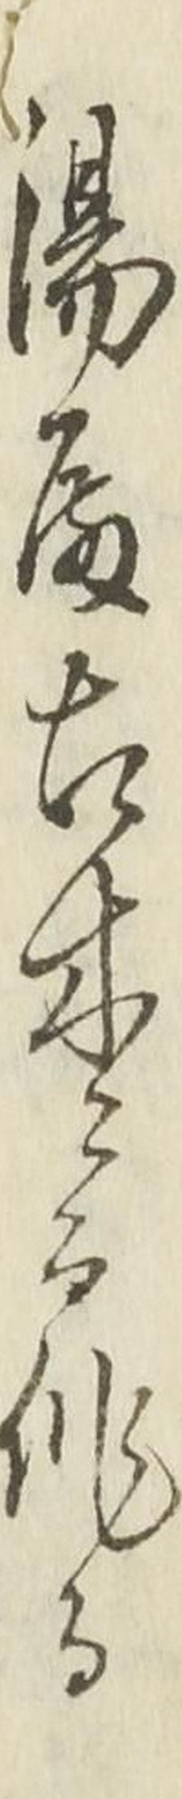湯殿古木ニ而作る
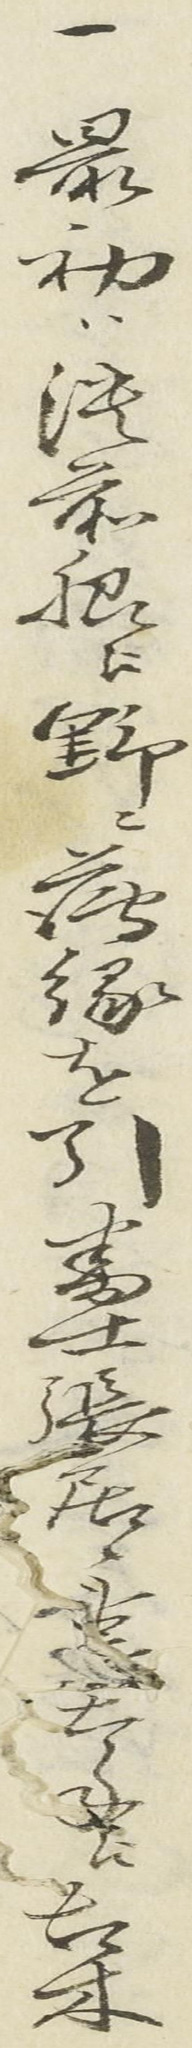一最初ハ潰れ前脇え野ニ薄縁を引番士張居候土手え古木
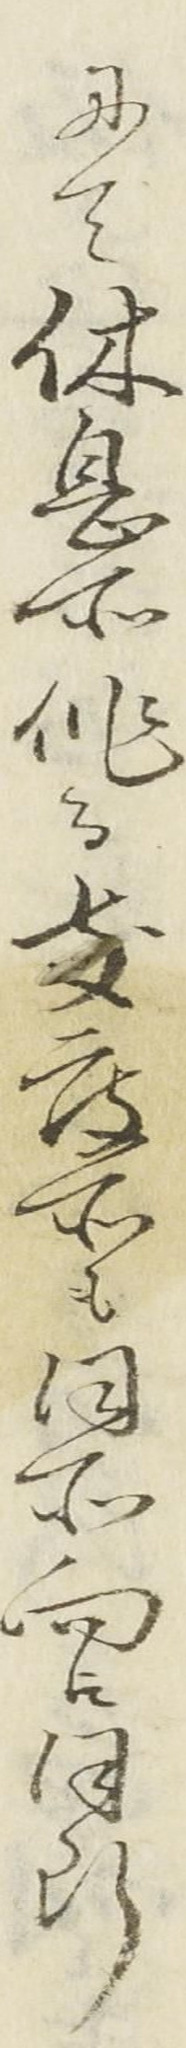にて休息所作る支度所も同所向え同断
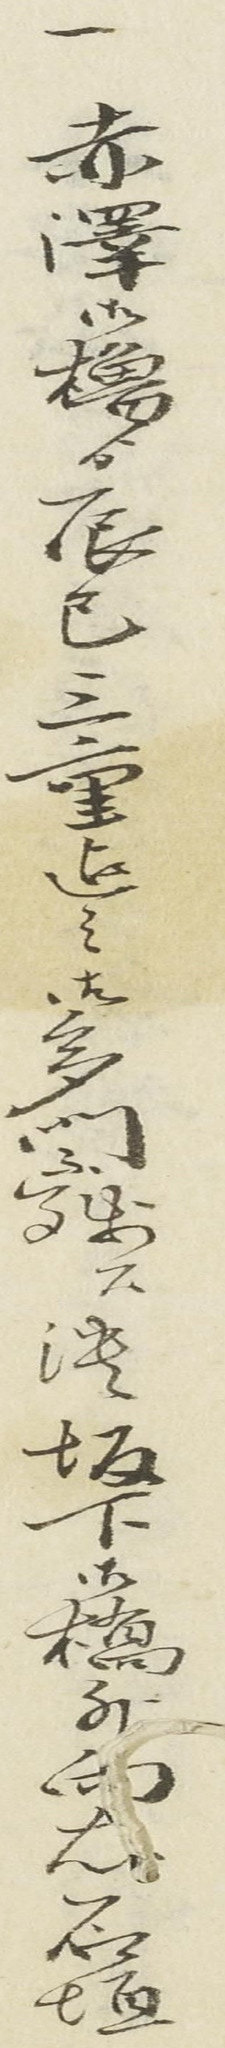一赤澤御櫓より辰巳三重迄之御多門不残ス潰坂下御橋外向は石垣
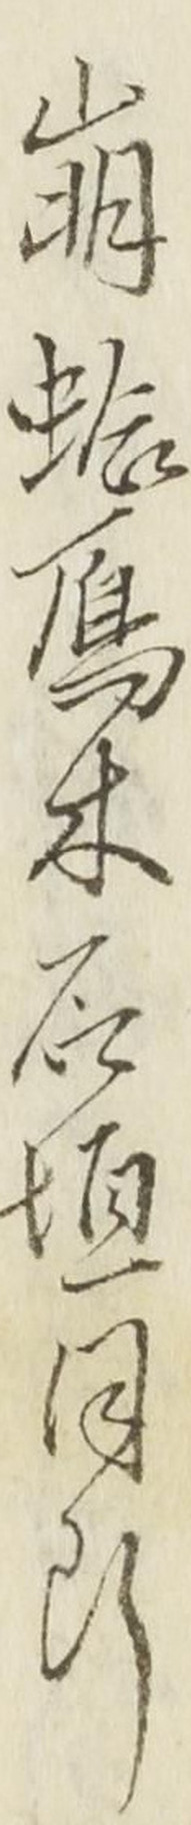崩蛤鳫木石垣同断
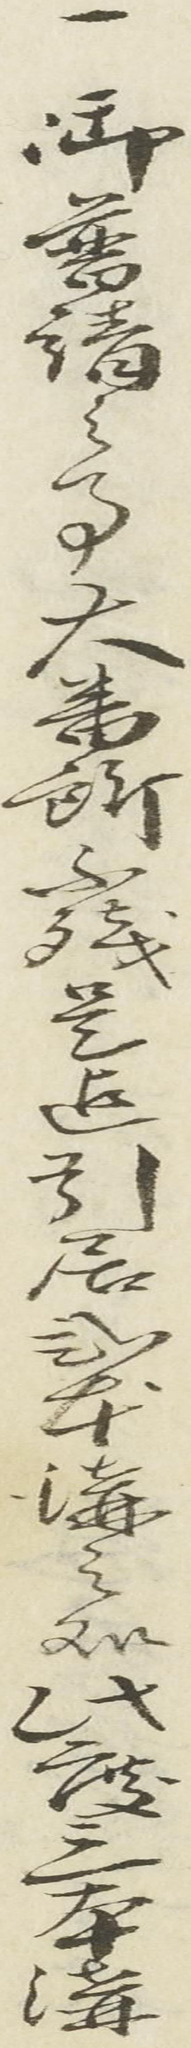一御普請之事大番所不残是迄引居弐本溝之処此度三本溝
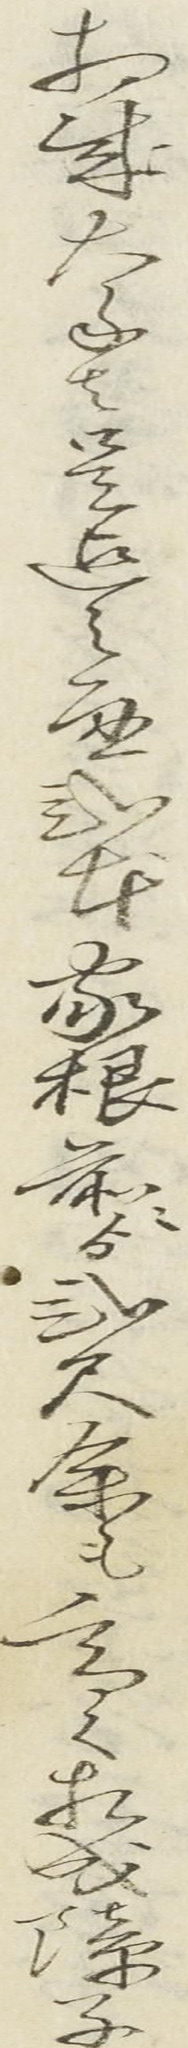相成大手は是迄之通弐本家根前々ゟ弐尺余も高く相成障子
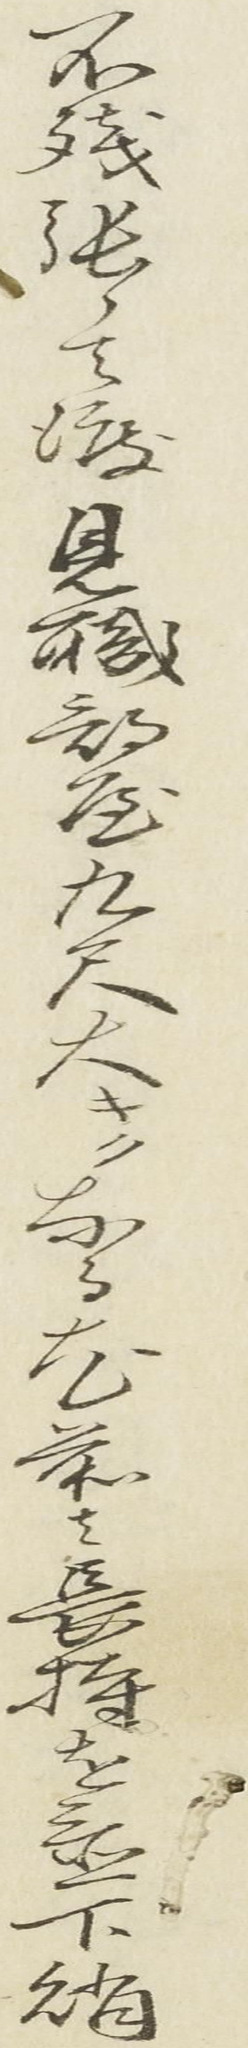不残張りて渡見職部屋九尺大キクなる尤前は長持置下賄
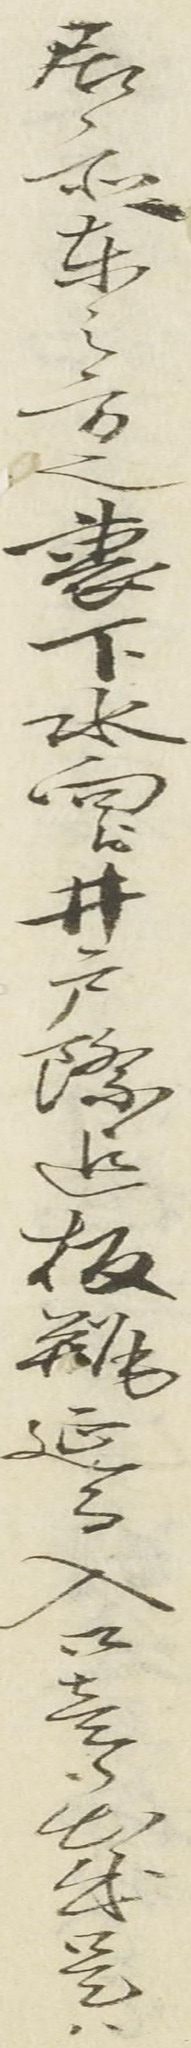居候所東之方也裏下水向え井戸際迄板瓶延る入口壱ツ出来是ハ
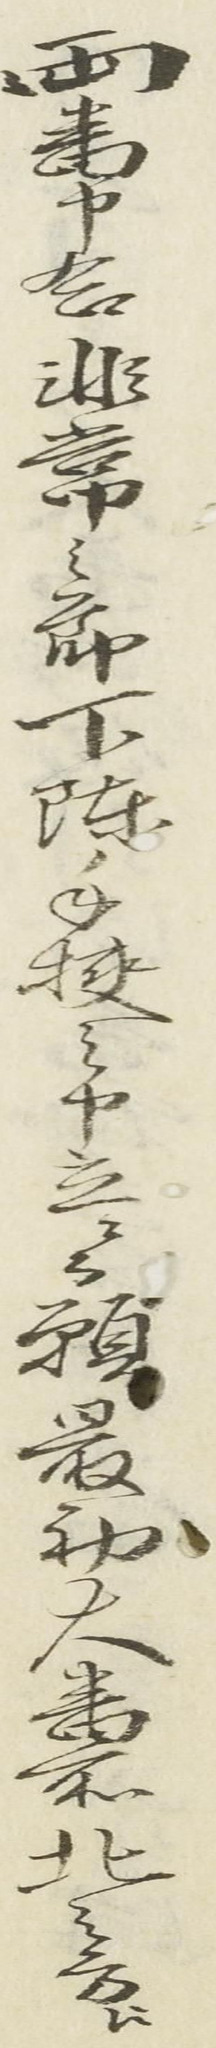両番申合非常之節下陣手狭之申立ニ而願最初大番所北之方え
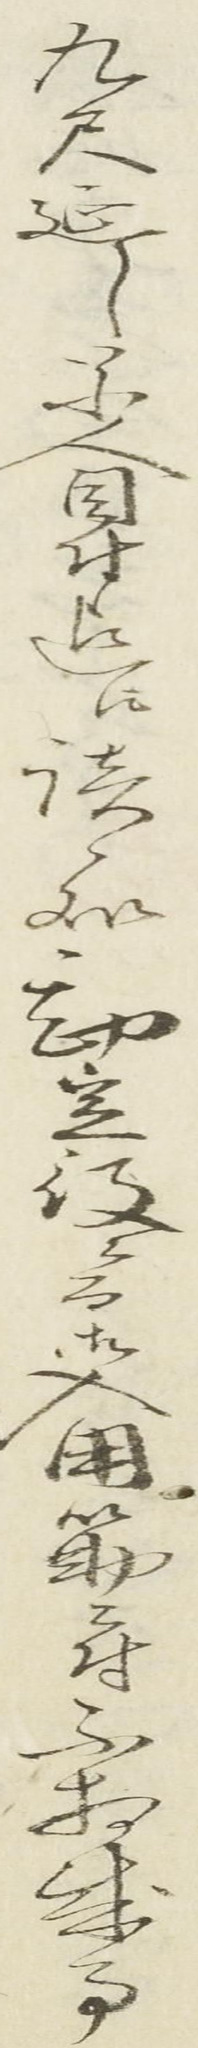九尺延し御小人目付迄え談候処勘定役ニ而御入用筋ニ付不相成事
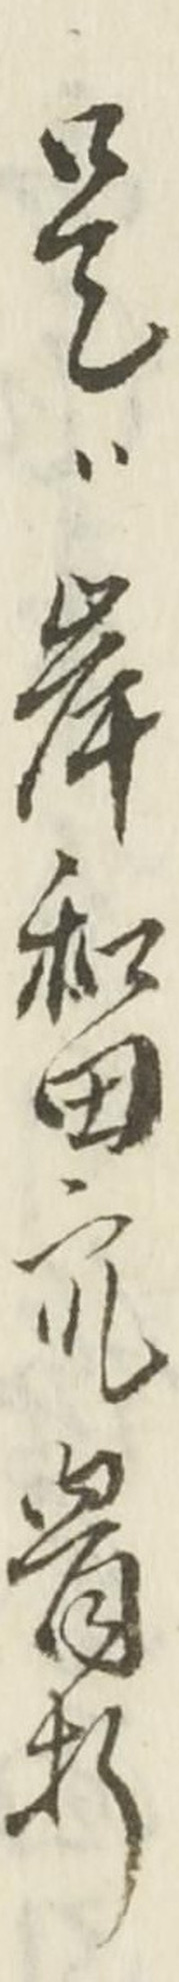是ハ岸和田衆骨折
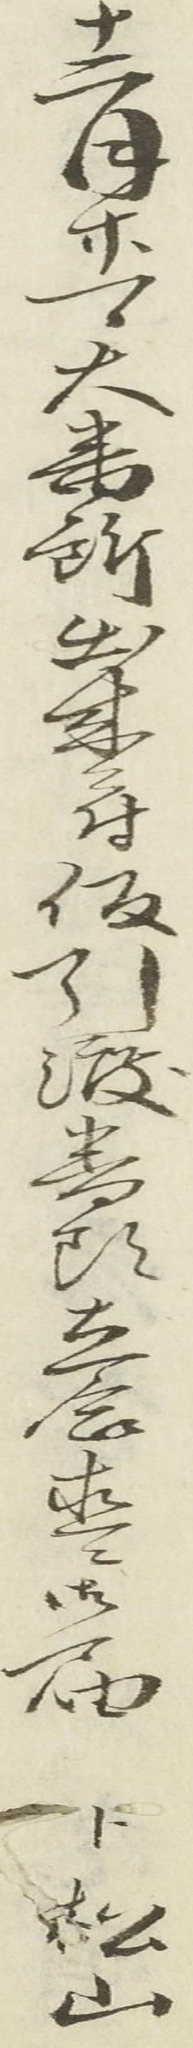十二月廿一日大番所出来ニ付仮引渡番頭立合直ニ御届ト松山
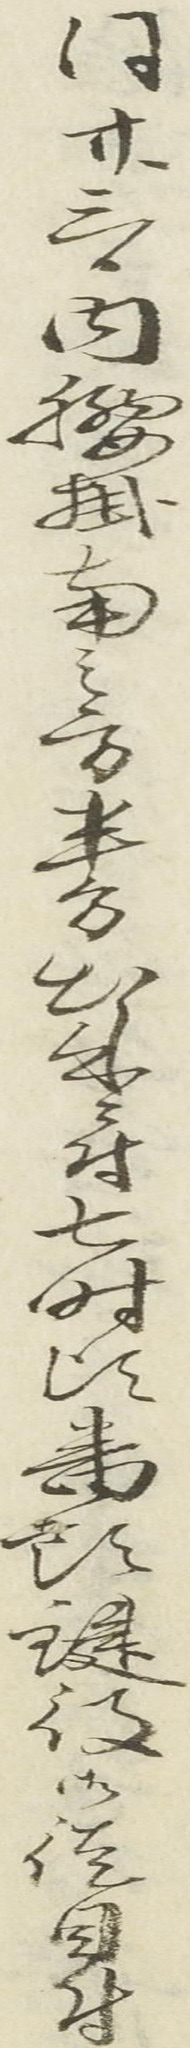同廿三日内腰掛南之方半方出来ニ付七時頃番頭鍵役御徒目付
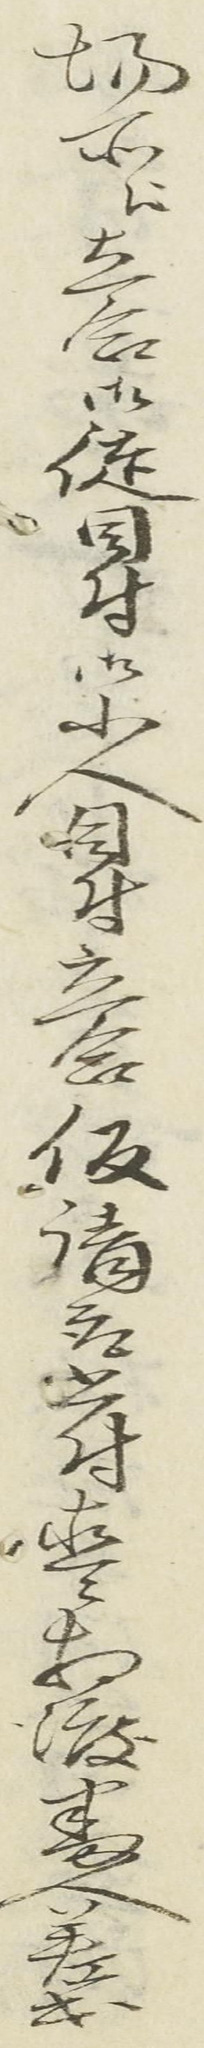場所え立合御徒目付御御小人目付立合仮請取書付直ニ相渡番人差出
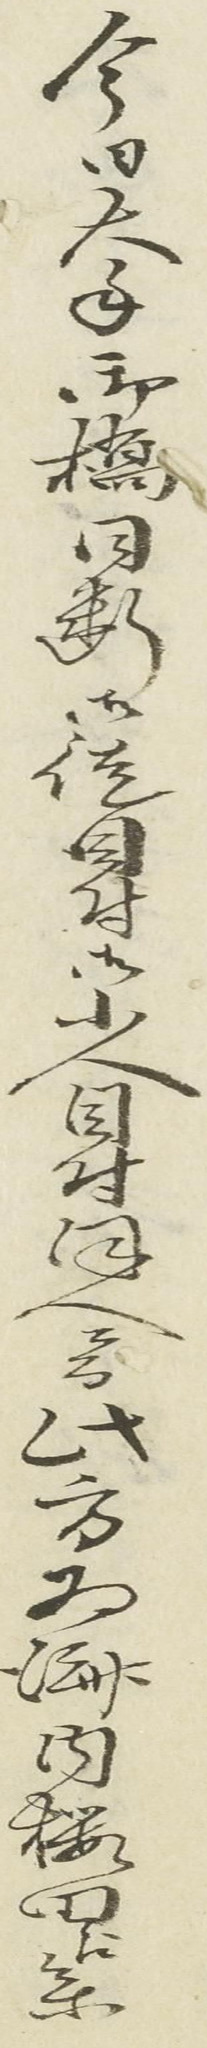今日大手御橋同断御徒目付御小人目付同人ニ而此方為済内桜田え参
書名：安政二乙卯年十月二日大地震之事
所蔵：東京大学地震研究所図書室 Earthquake Research Institute Library, The University of Tokyo, JAPAN
